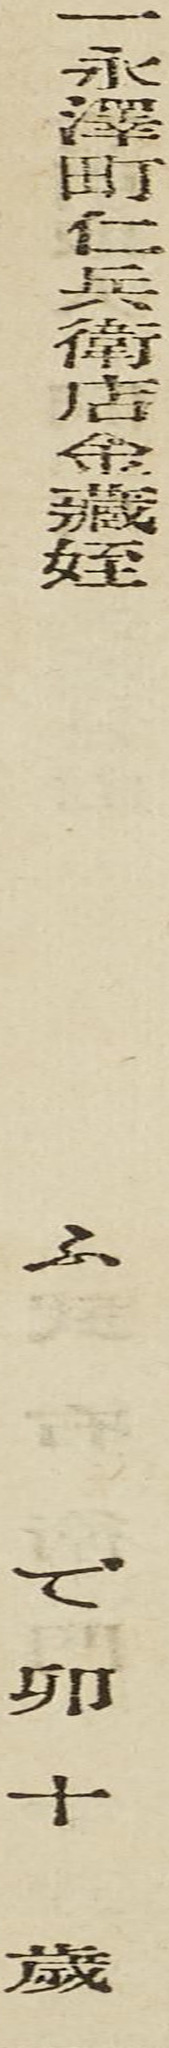一永澤町仁兵衛店金蔵姪ふで卯十歳
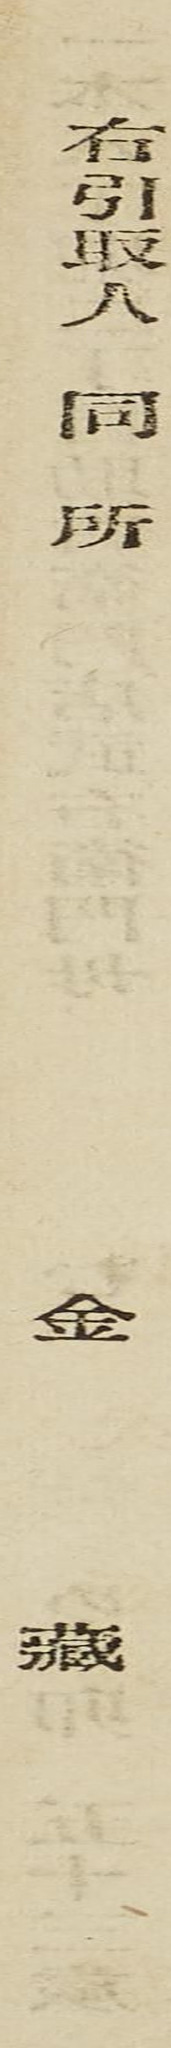右引取人同所金蔵
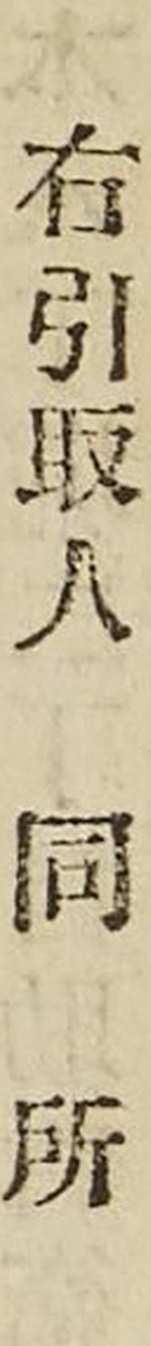右引取人同同
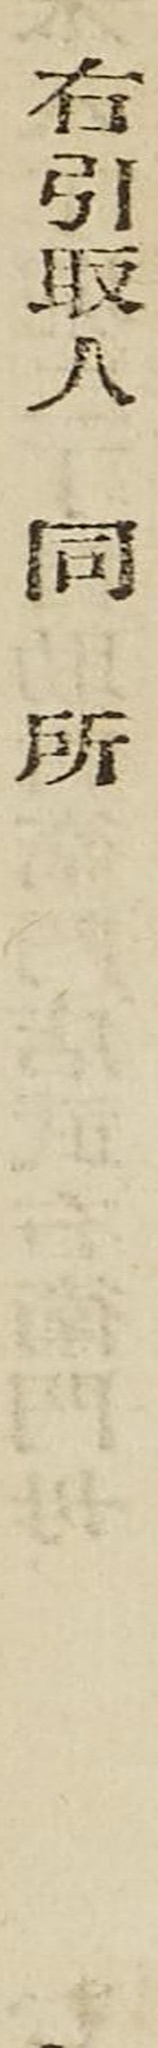右引取人同同

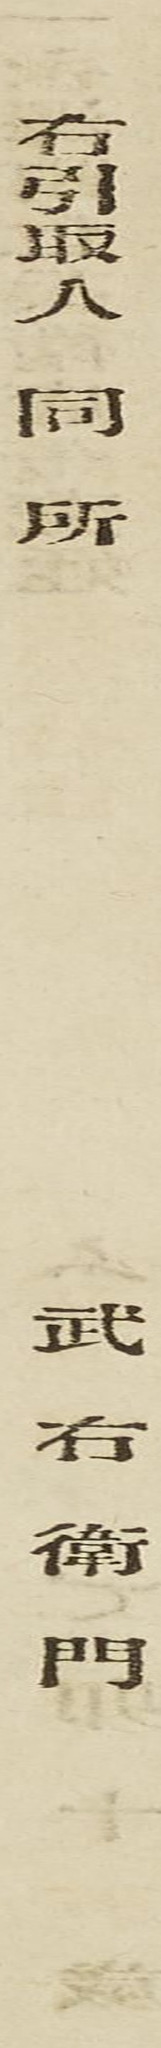右引取人同所武右衛門
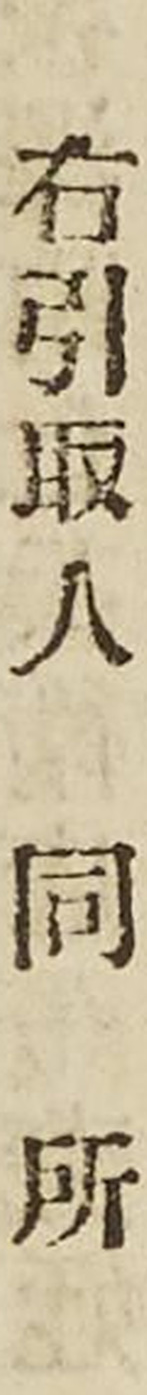右引取人同同
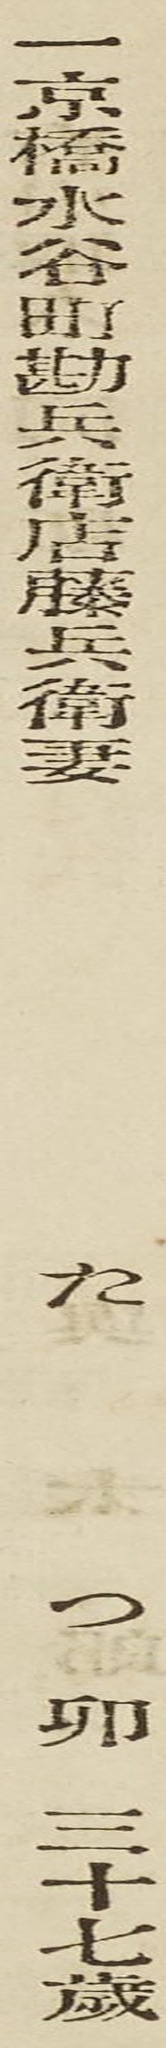一京橋水谷町勘兵衛店藤兵衛妻たつ卯三十七歳
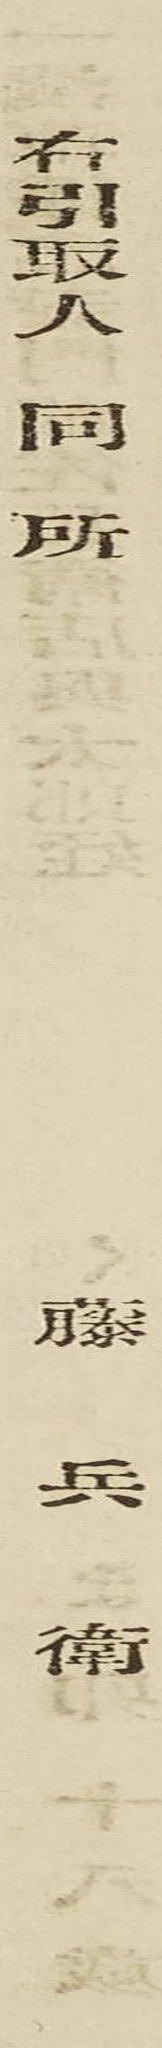右引取人同所藤兵衛
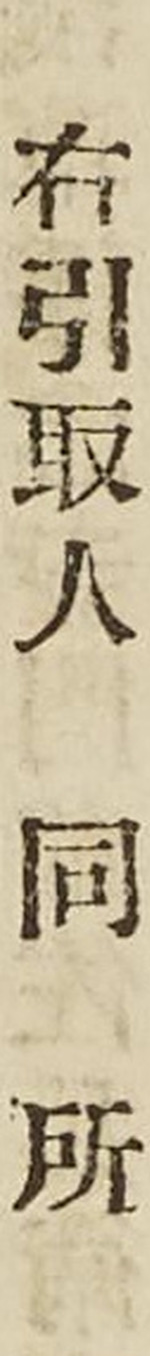右引取人同同
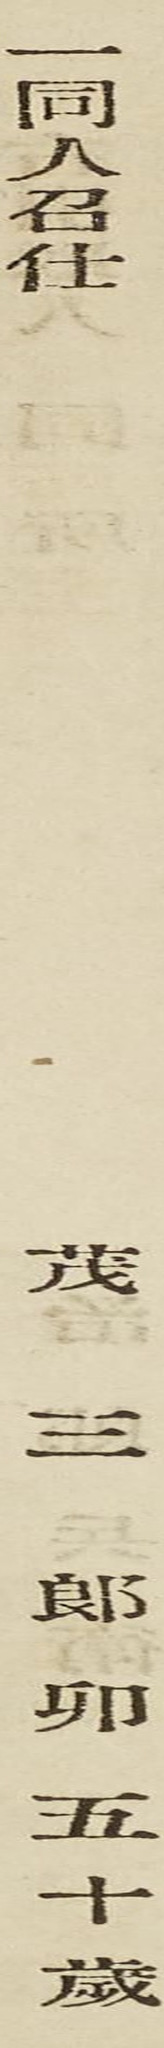一同人召仕茂三郎卯五十歳
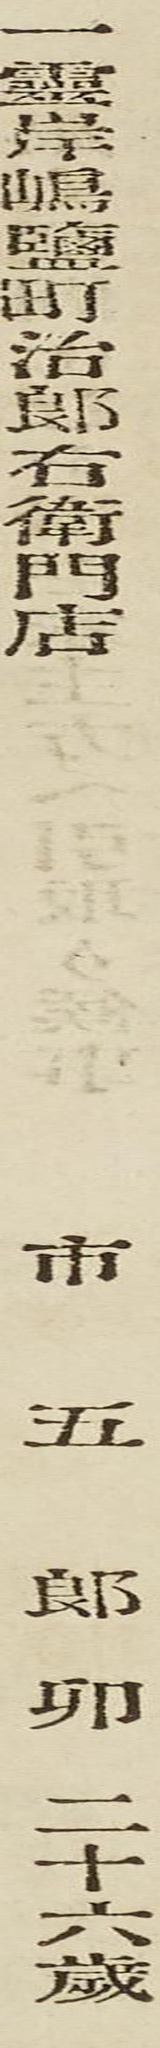一帝岸嶋鹽町治郎右衛門店市五郎卯二十六歳
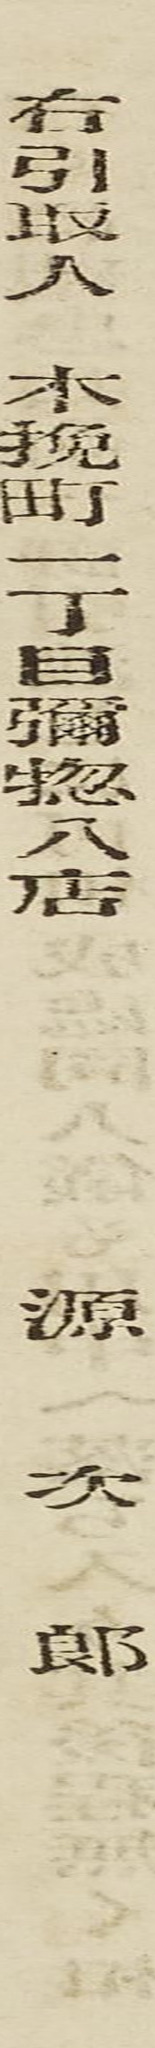右引取人木挽町一丁目彌惣八店源次郎
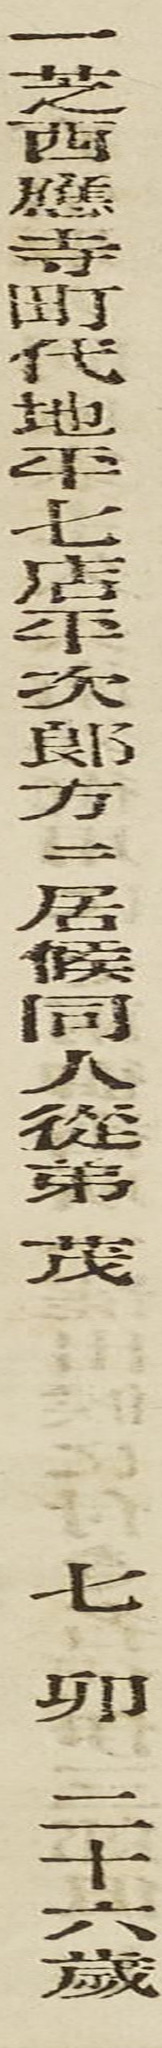一芝西應寺町代地平七店平次郎方ニ居候同人従弟茂七卯二十六歳
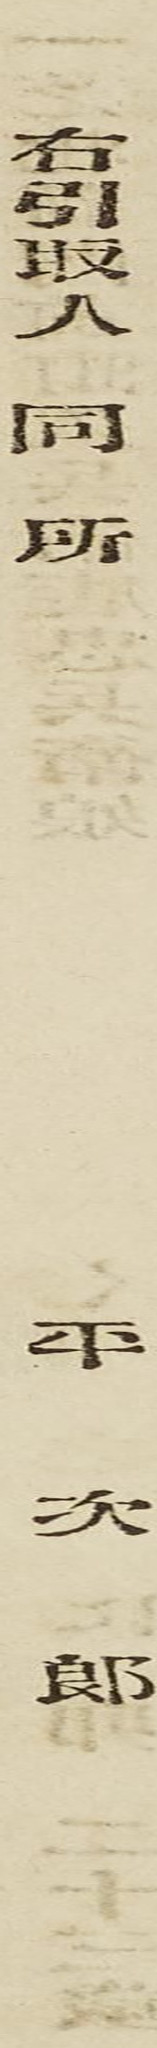右引取人同所平次郎
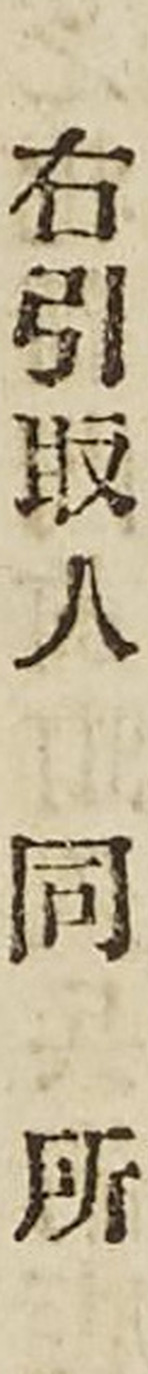右引取人同同
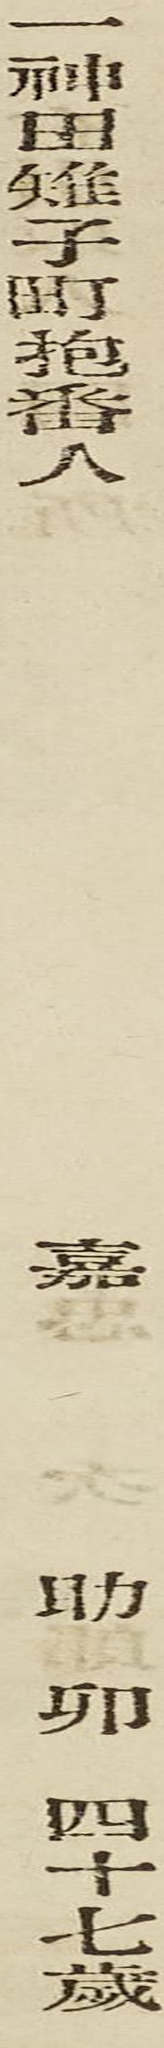一神田雉子町抱番人嘉助卯四十七歳
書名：永代惨話　文化の夢　全
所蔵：東京大学地震研究所図書室 Earthquake Research Institute Library, The University of Tokyo, JAPAN
